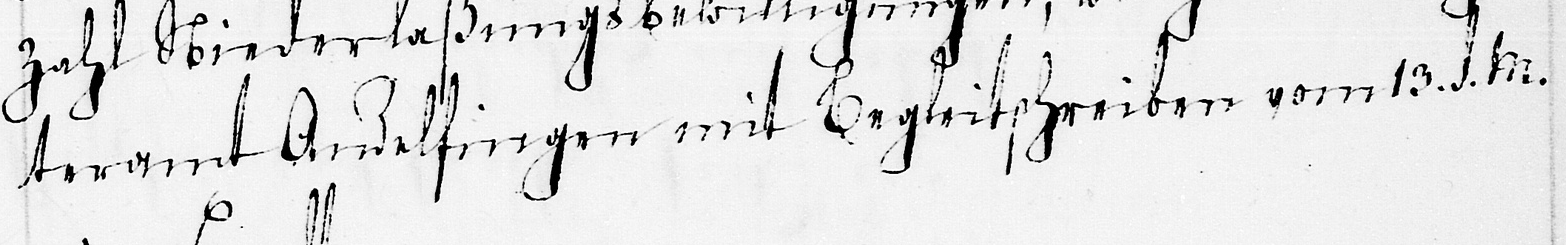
teramt Andelfingen mit Begleitschreiben vom 13. d. M.
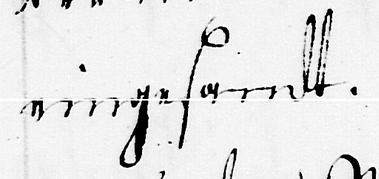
eingesandt.
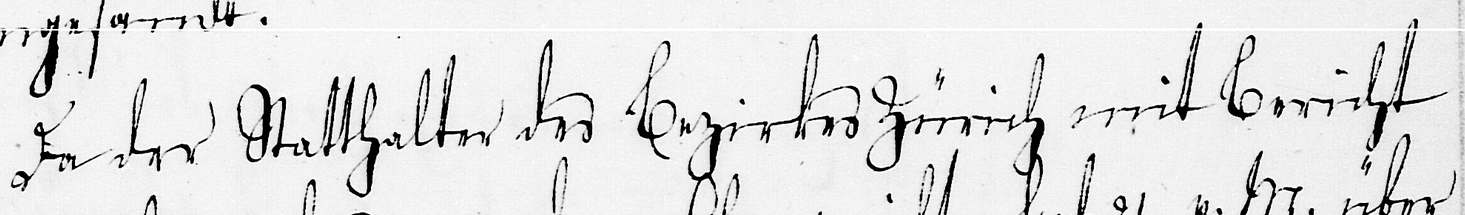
Da der Statthalter des Bezirkes Zürich mit Bericht
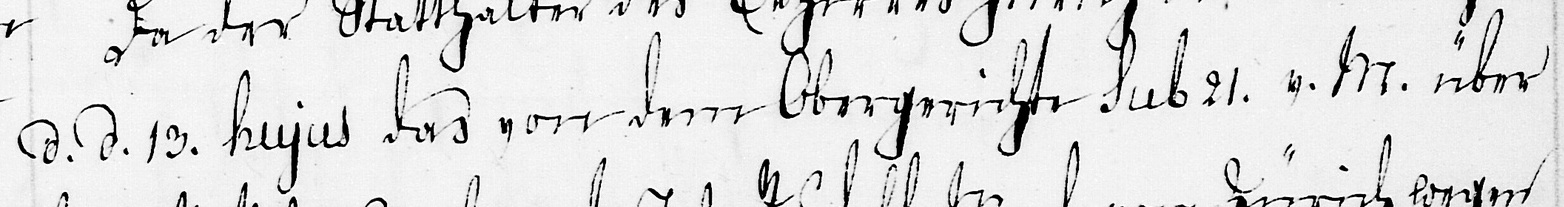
d. d. 13. hujus das von dem Obergerichte sub 21. v. M. über
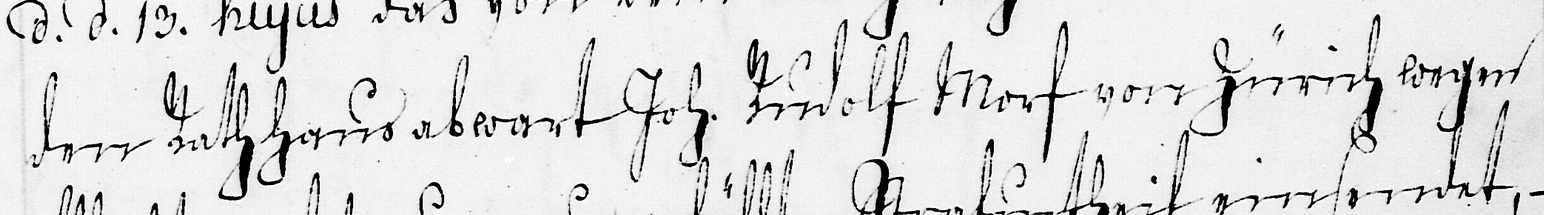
den Rathhausabwart Joh. Rudolf Morf von Zürich wegen
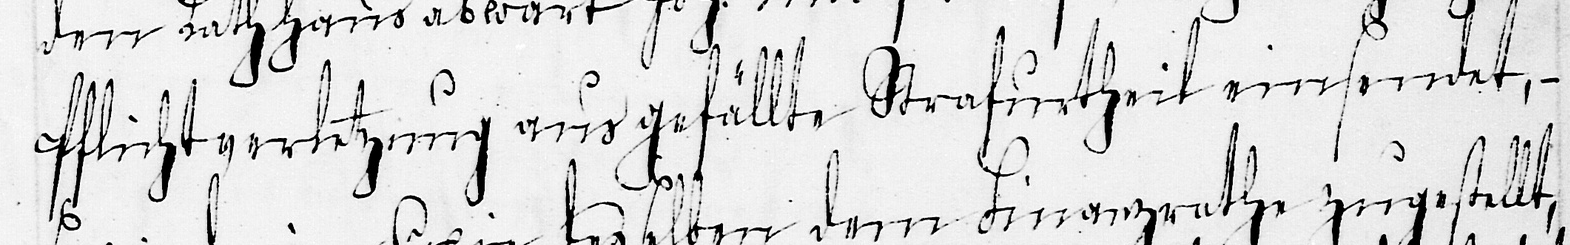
Pflichtverletzung ausgefällte Strafurtheil einsendet, –
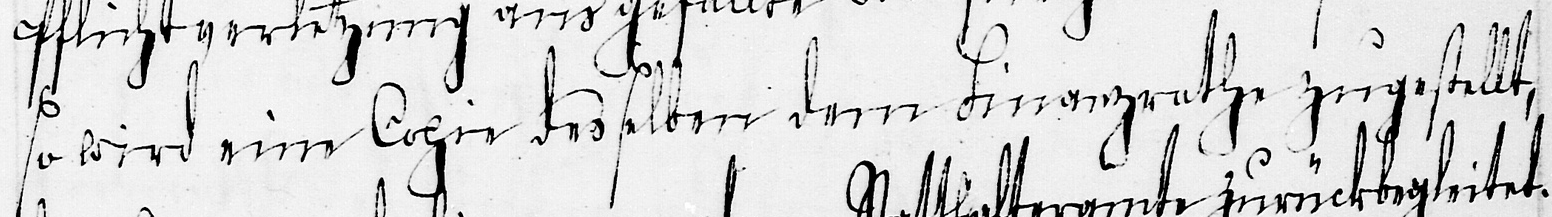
so wird eine Copie desselben dem Finanzrathe zugestellt,
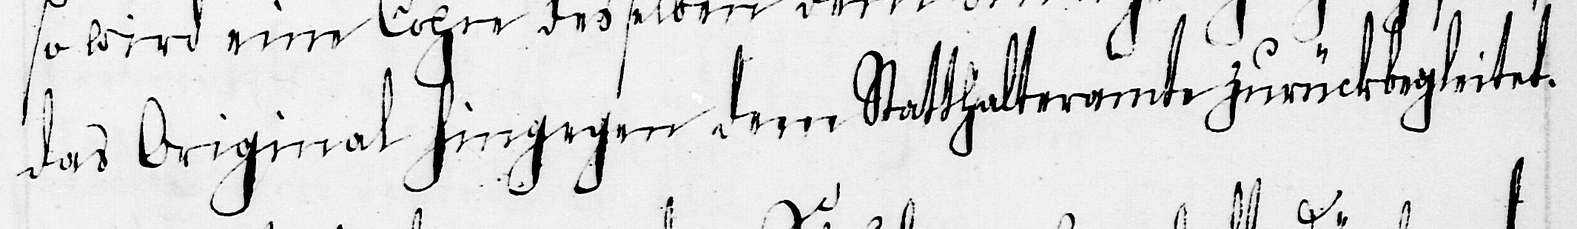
das Original hingegen dem Statthalteramte zurückbegleitet.
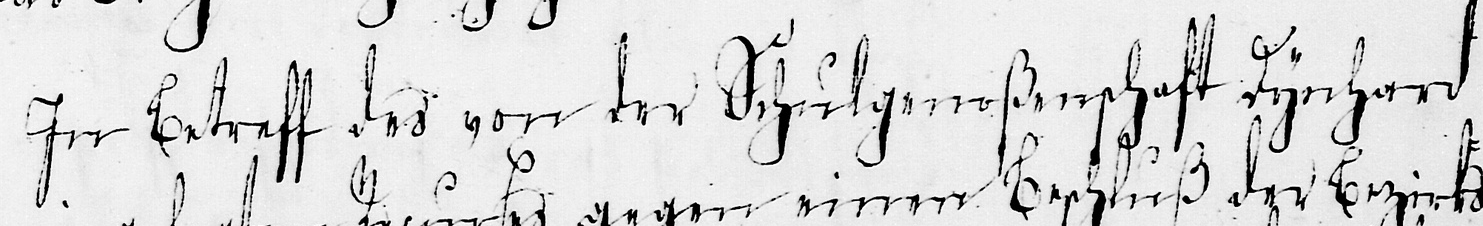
In Betreff des von der Schulgenoßenschaft Dynhard
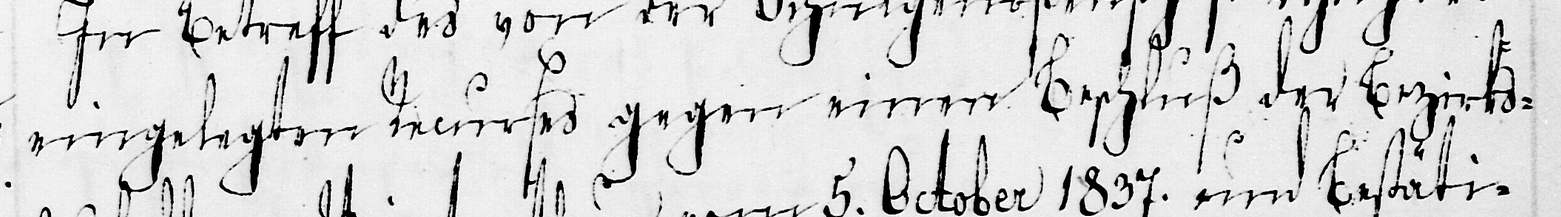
eingelegten Recurses gegen einen Beschluß der Bezirks¬
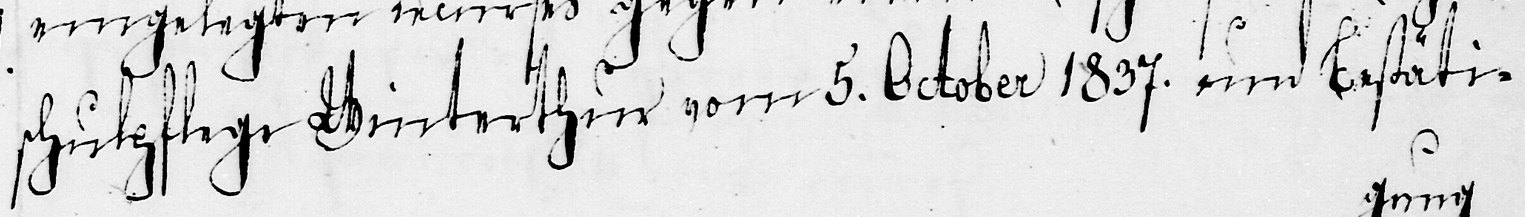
schulpflege Winterthur vom 5. October 1837. und Bestäti-
